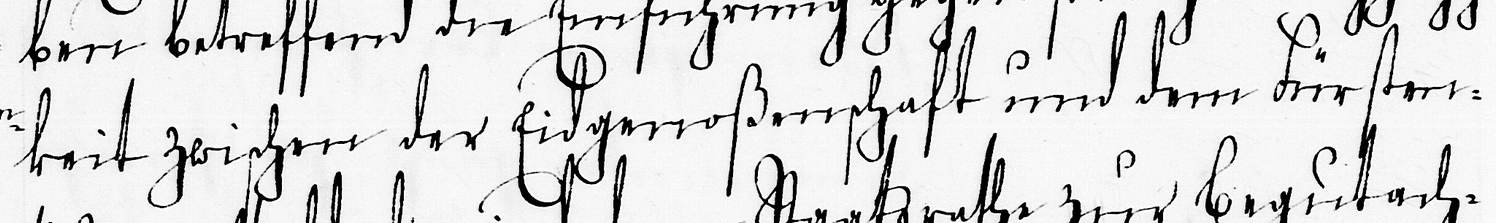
keit zwischen der Eidgenoßenschaft und dem Fürsten¬
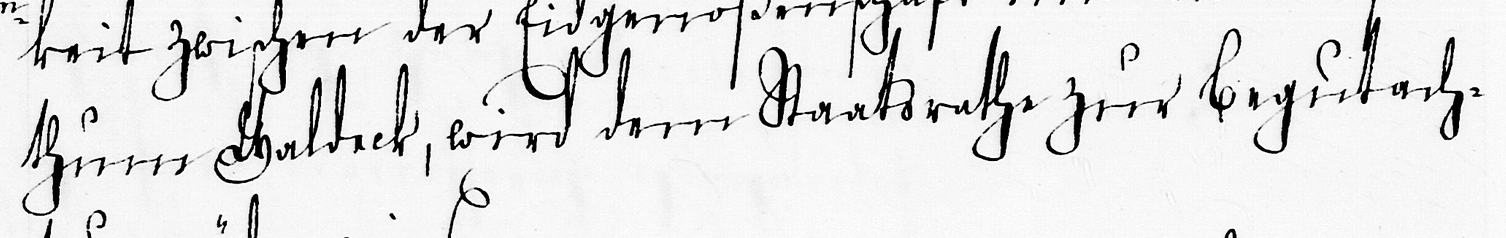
thum Waldeck, wird dem Staatsrathe zur Begutach¬
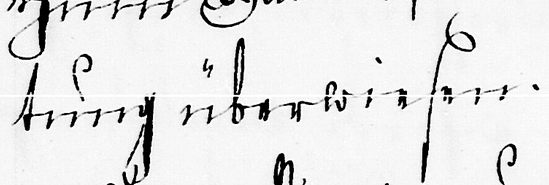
tung überwiesen.
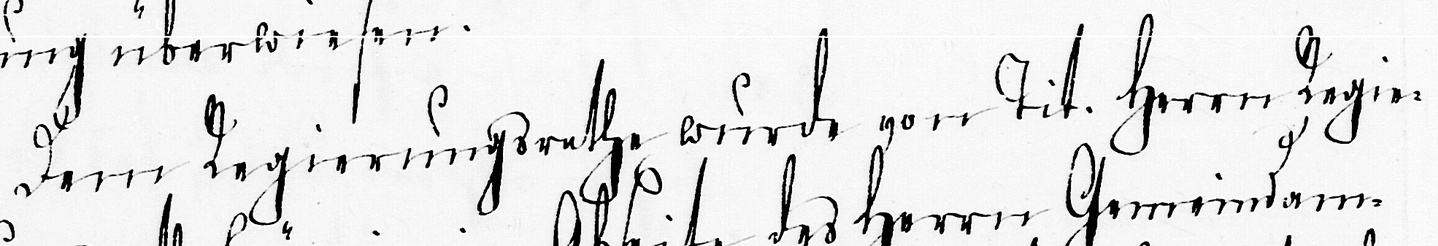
Dem Regierungsrathe wurde von Tit. Herrn Regie¬
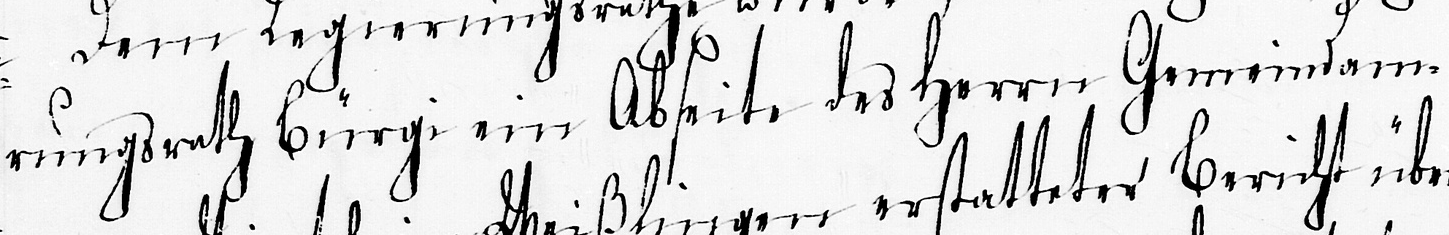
rungsrath Bürgi ein Abseite des Herrn Gemeindam¬
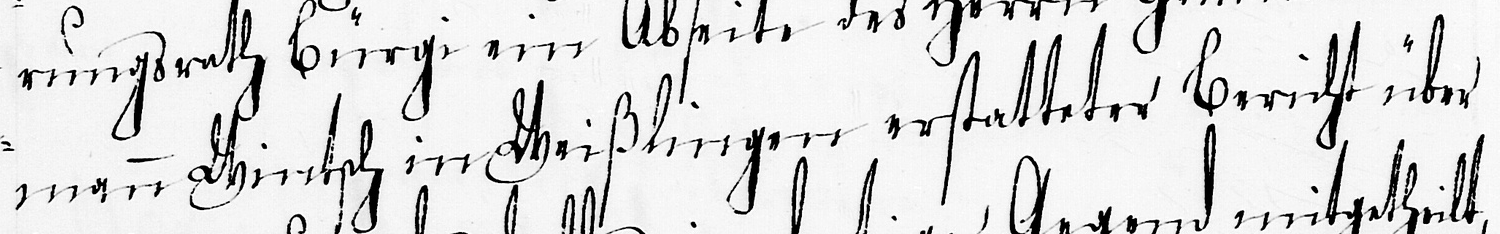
mann Wintsch in Weißlingen erstatteter Bericht über
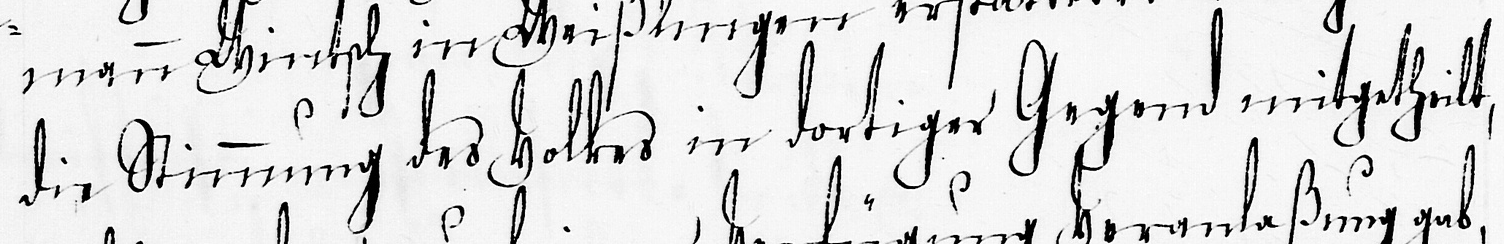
die Stimmung des Volkes in dortiger Gegend mitgetheilt,
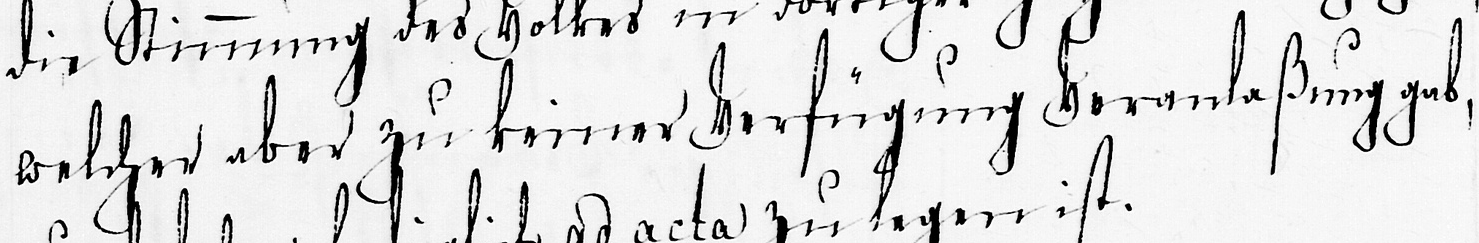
welcher aber zu keiner Verfügung Veranlaßung gab,
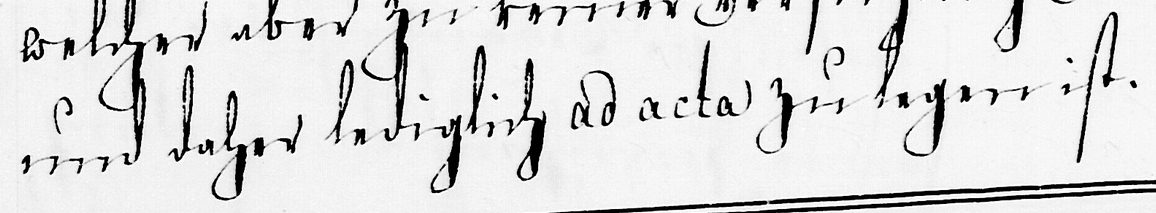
und daher lediglich ad acta zu legen ist.
